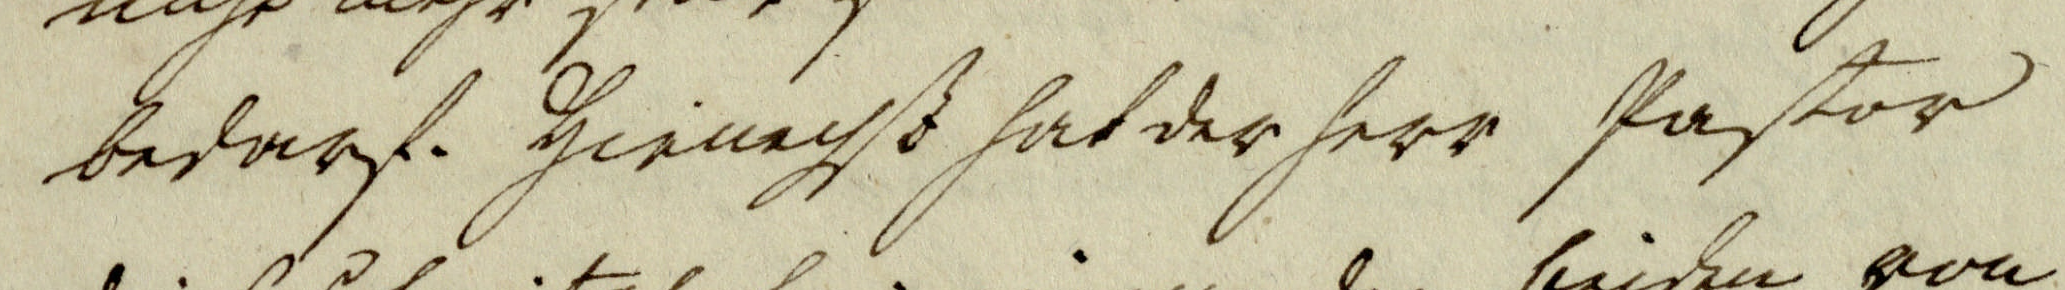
bedarf. Hienechst hat der Herr Pastor
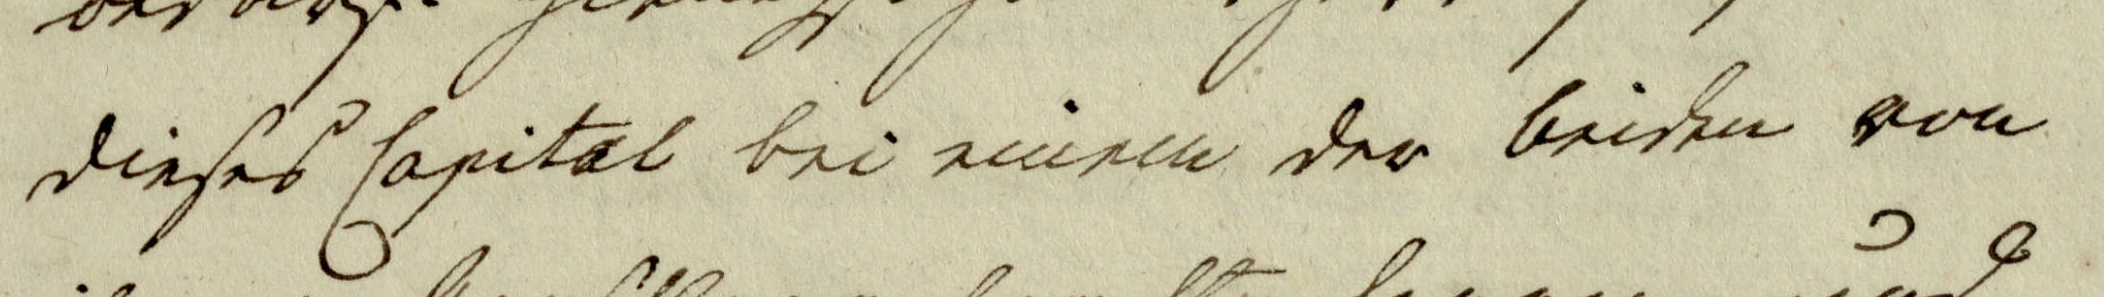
dieses Capital bei einem der beiden von
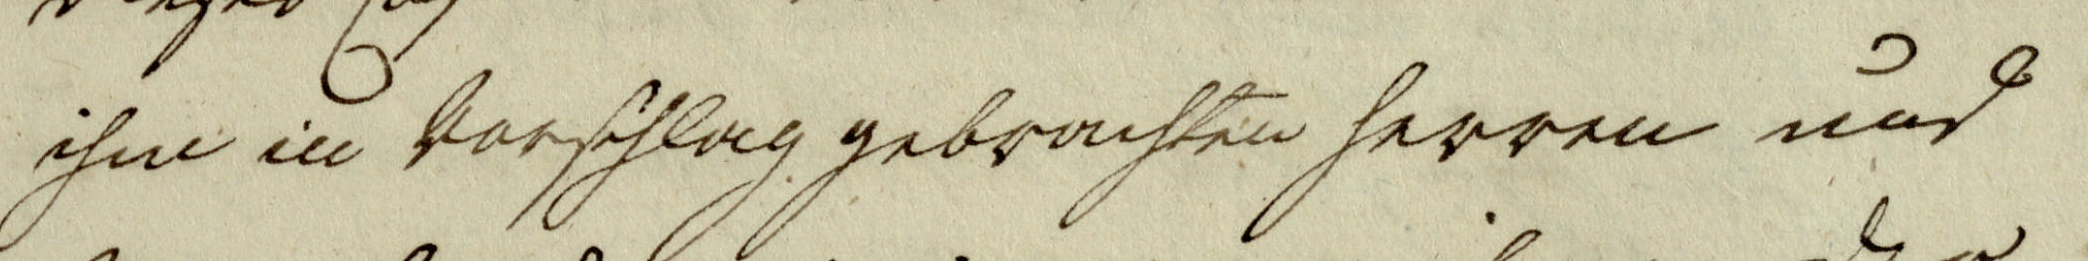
ihm in Vorschlag gebrachten Herren und
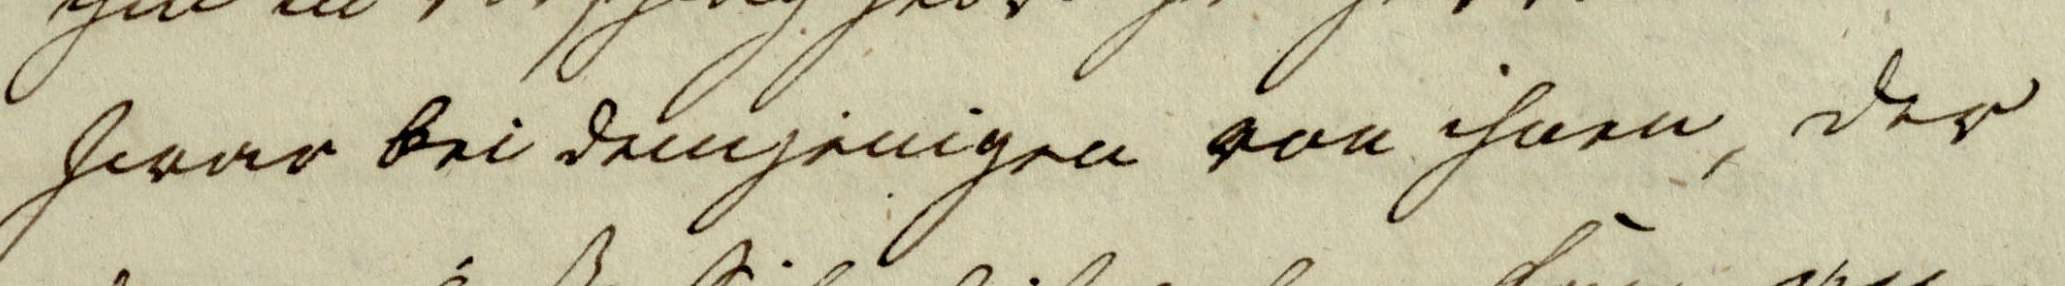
zwar bei demjenigen von ihnen, der
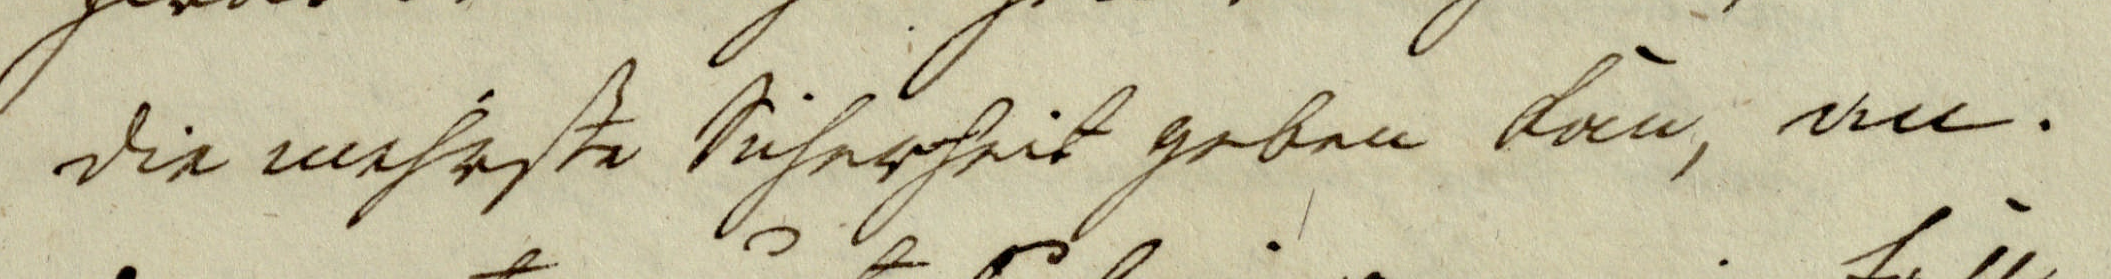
die mehrste Sicherheit geben kan, an¬
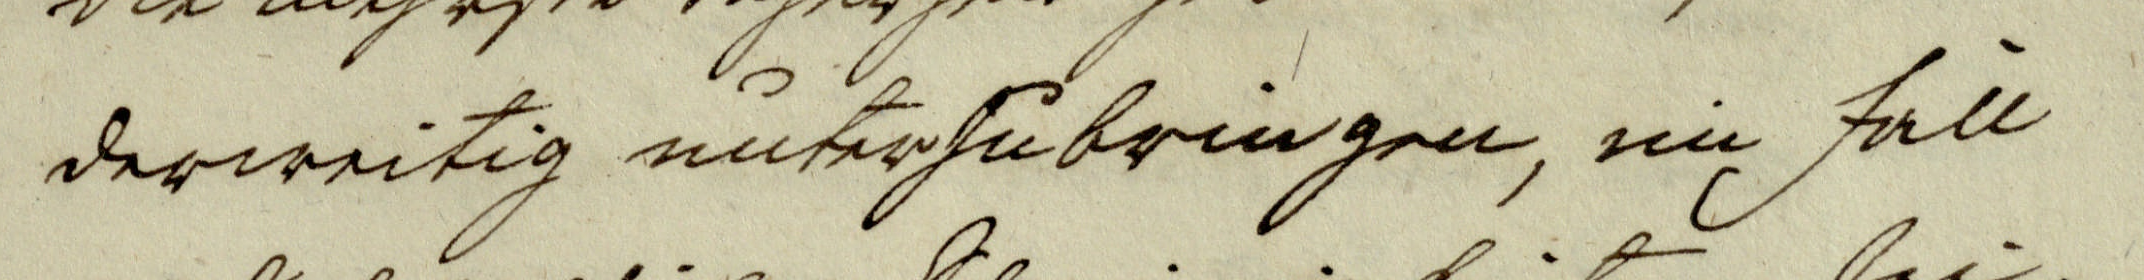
derweitig unterzubringen, im Fall
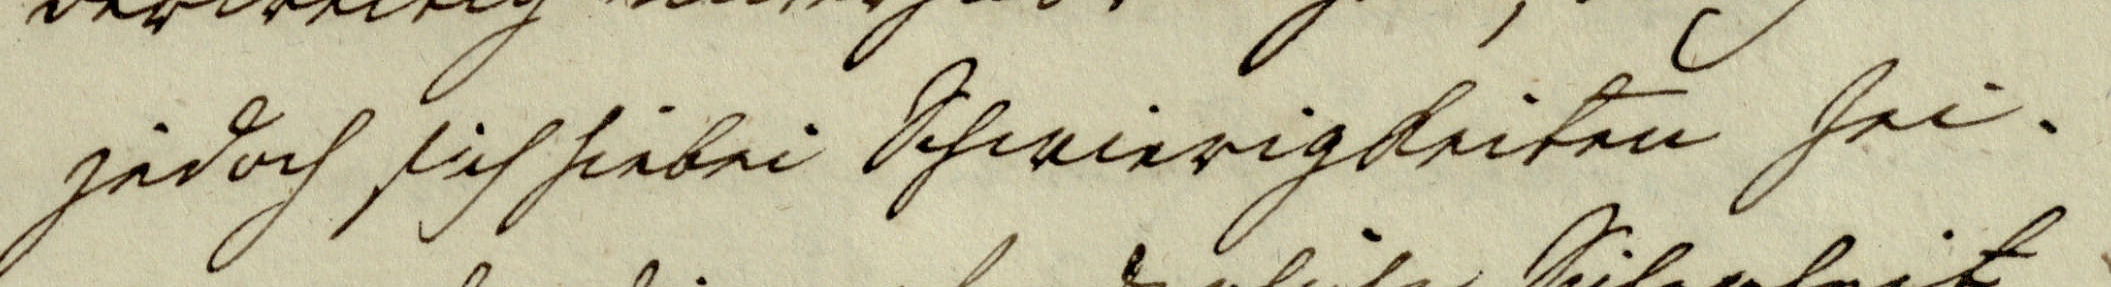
jedoch sich hiebei Schwierigkeiten zei¬
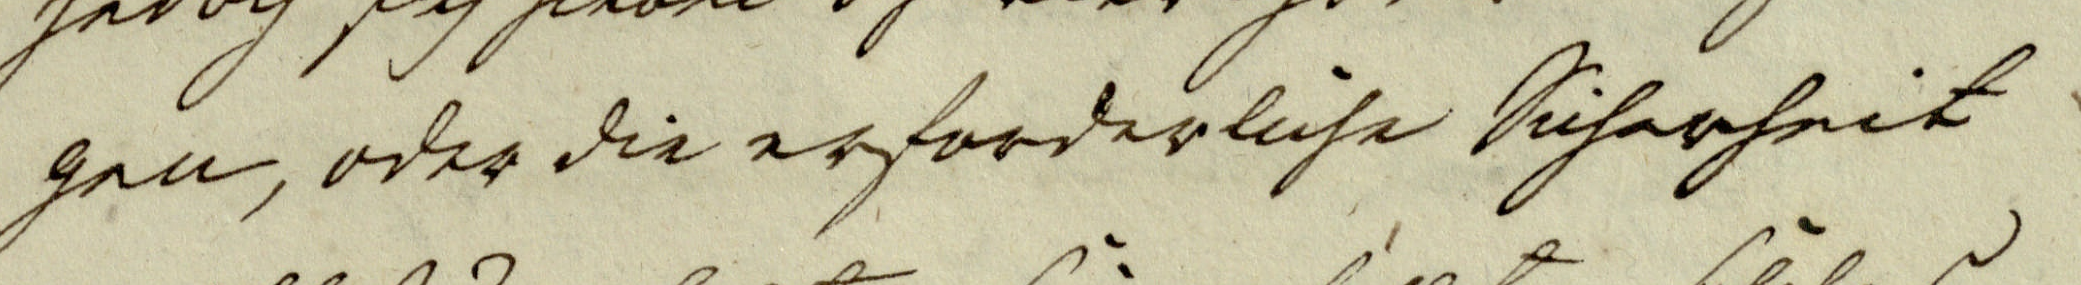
gen, oder die erforderliche Sicherheit
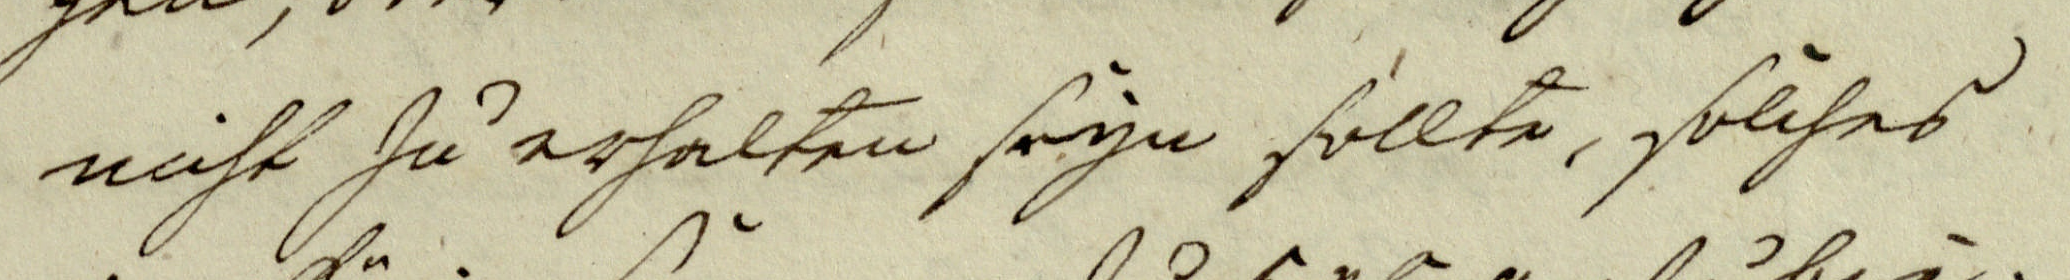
nicht zu erhalten seÿn sollte, solches
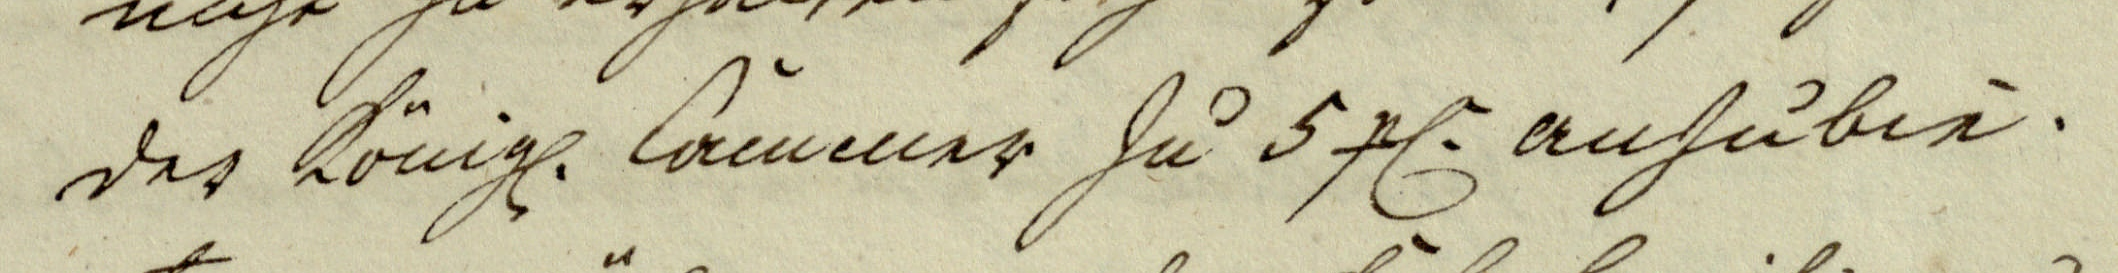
der Königl. Cammer zu 5 pl. anzubie¬
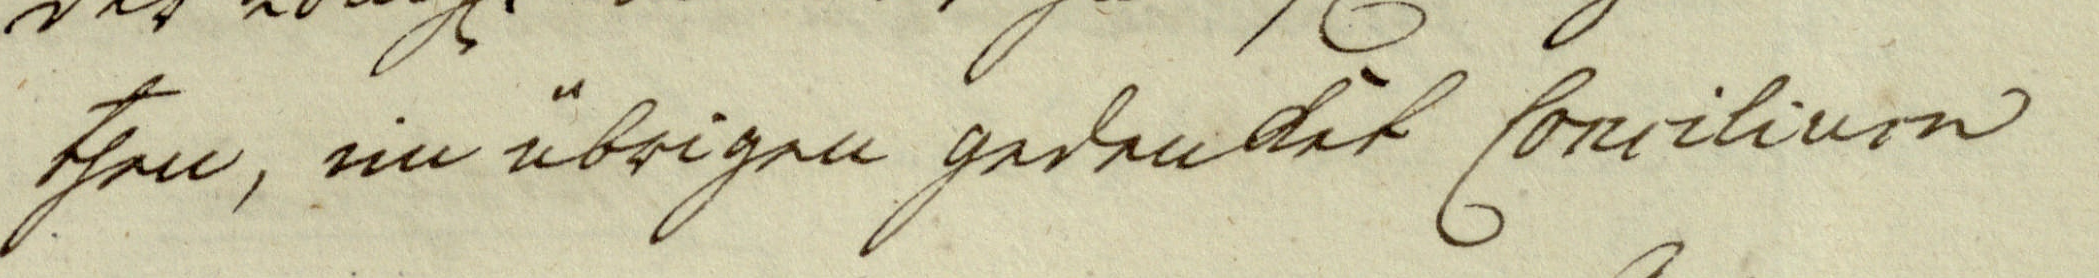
ten, im übrigen gedenket Concilium
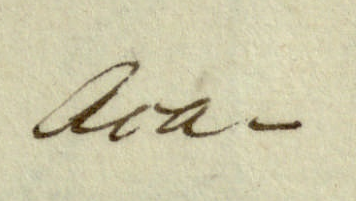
Aca¬
